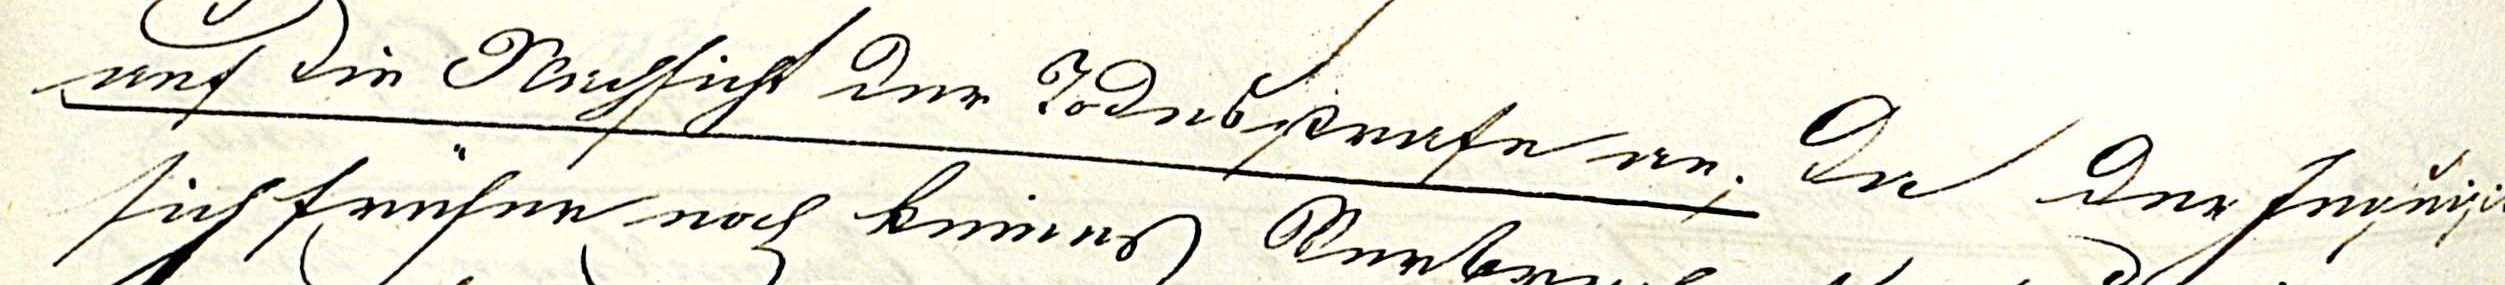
auf die Nachsicht der Todesstrafe an. Da der Inquisit
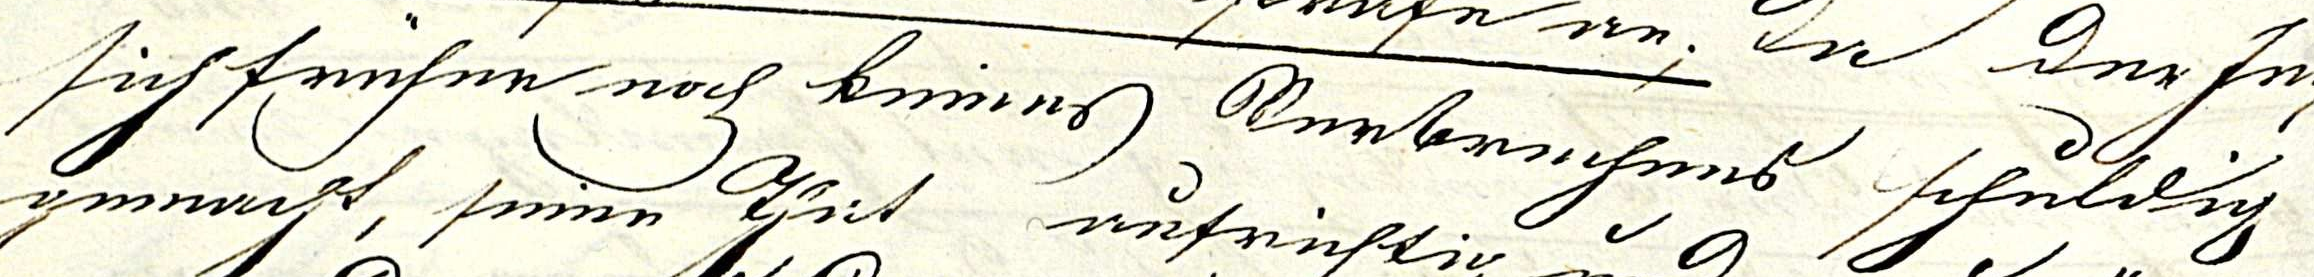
sich früher noch keines Verbrechens schuldig
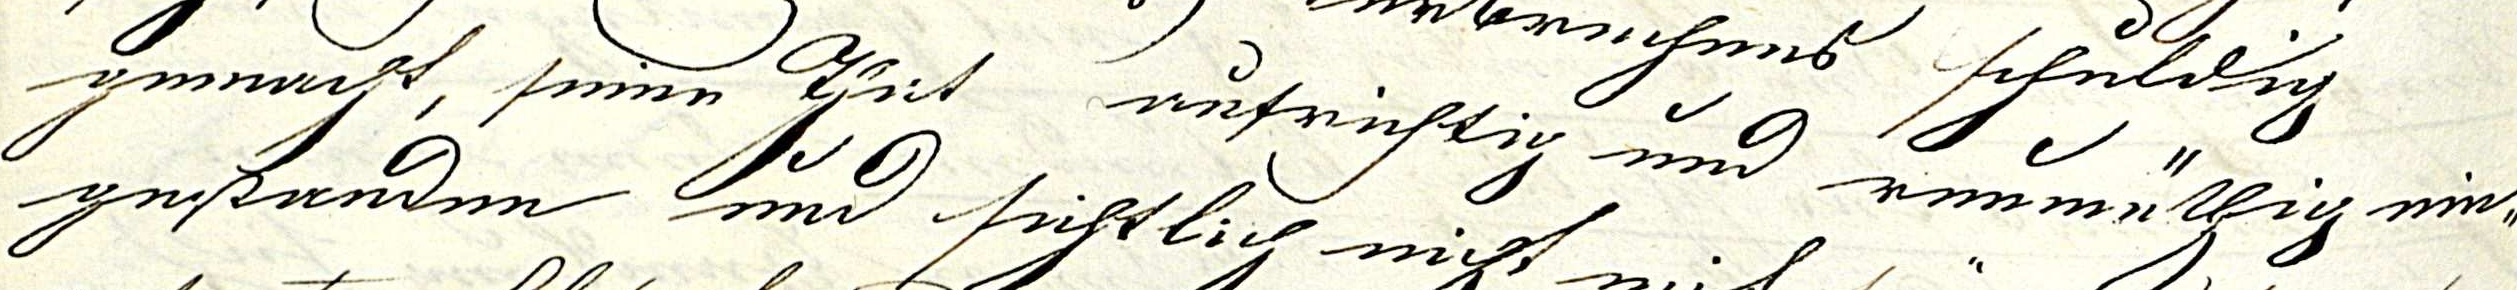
gemacht, sine That aufrichtig und reumüthig ein¬
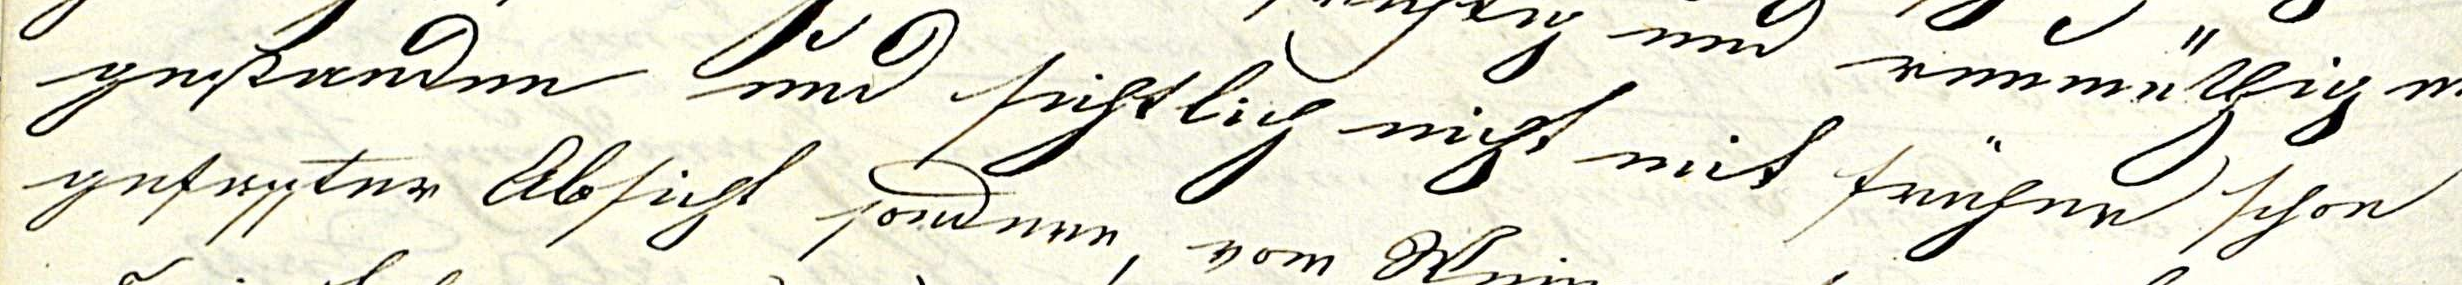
gestanden und sichtlich nicht imt früher schon
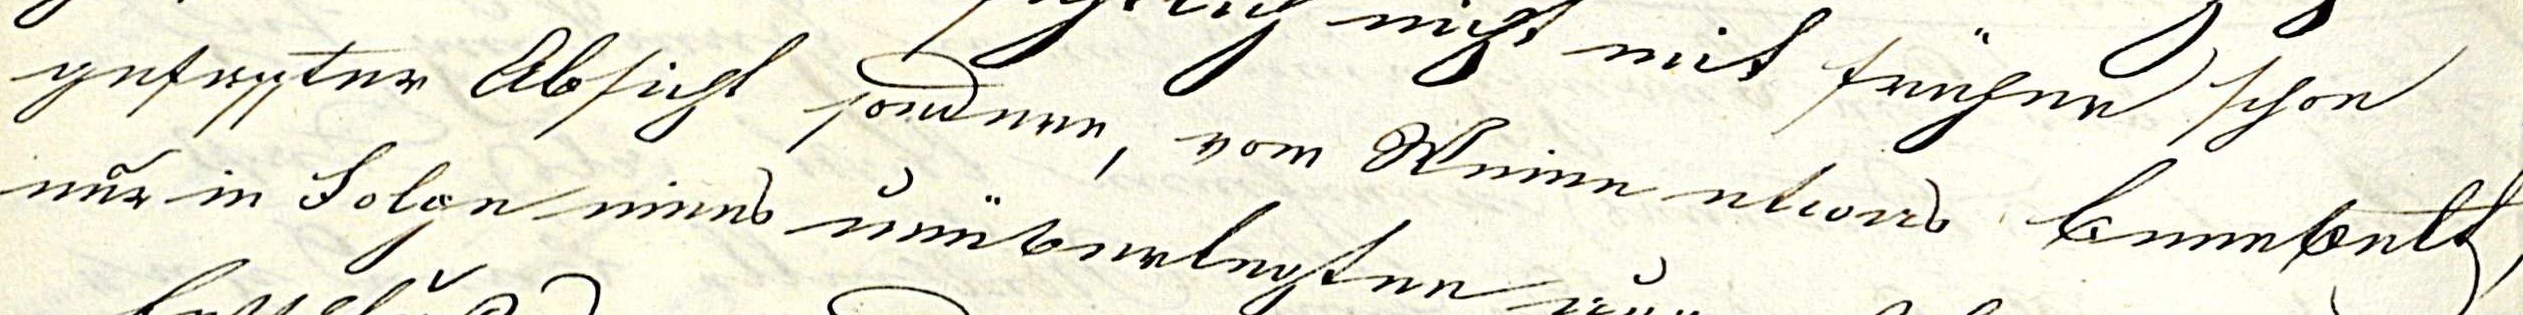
gefasster Absicht sondern, vom Weine etwas benebelt,
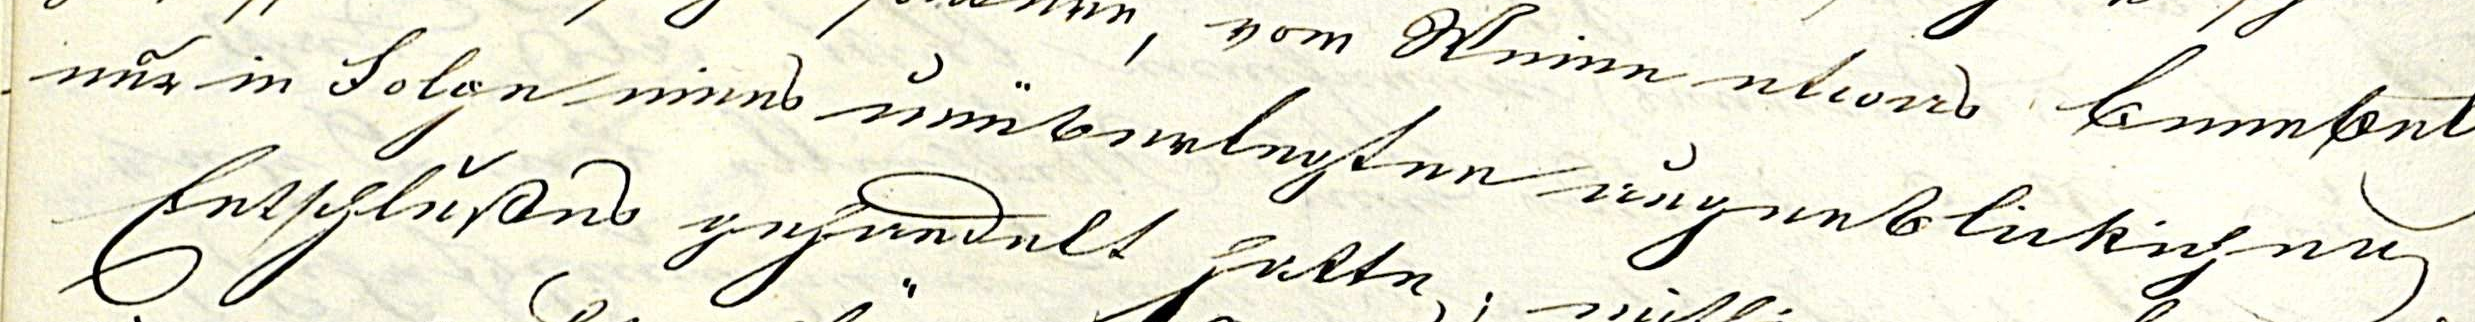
nur in Folge eines unüberlegten augenblicklichen
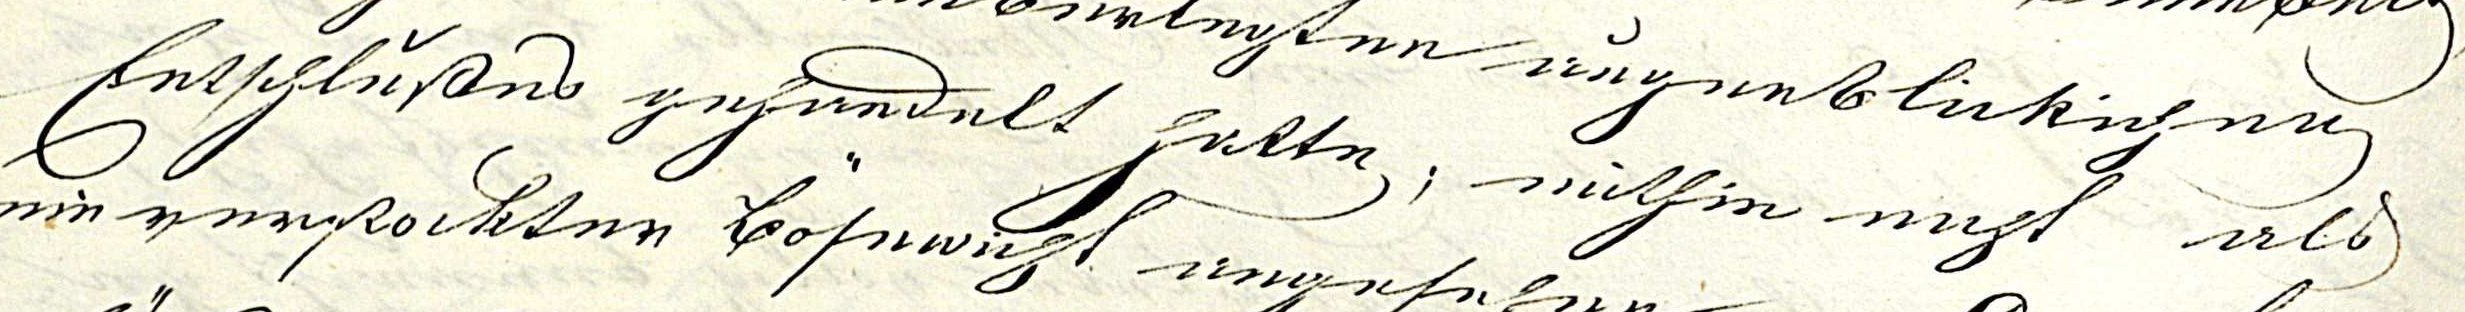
Entschlußes gehandelt hatte; mithin nicht als
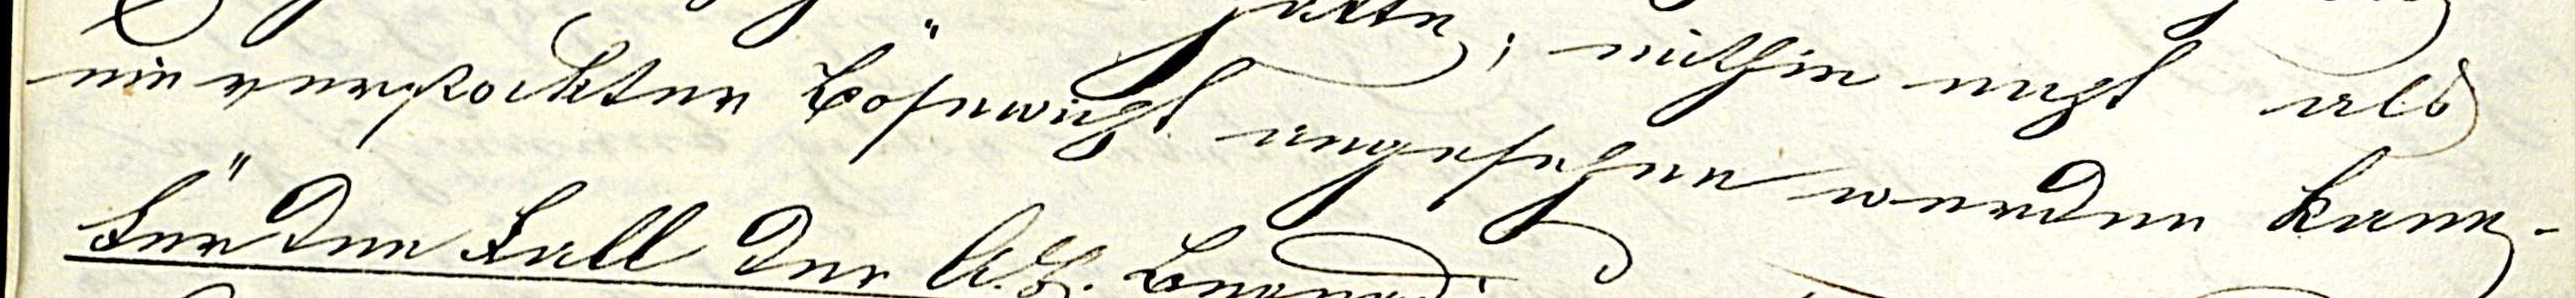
ein verstockten Bösewicht angesehen werden kann —
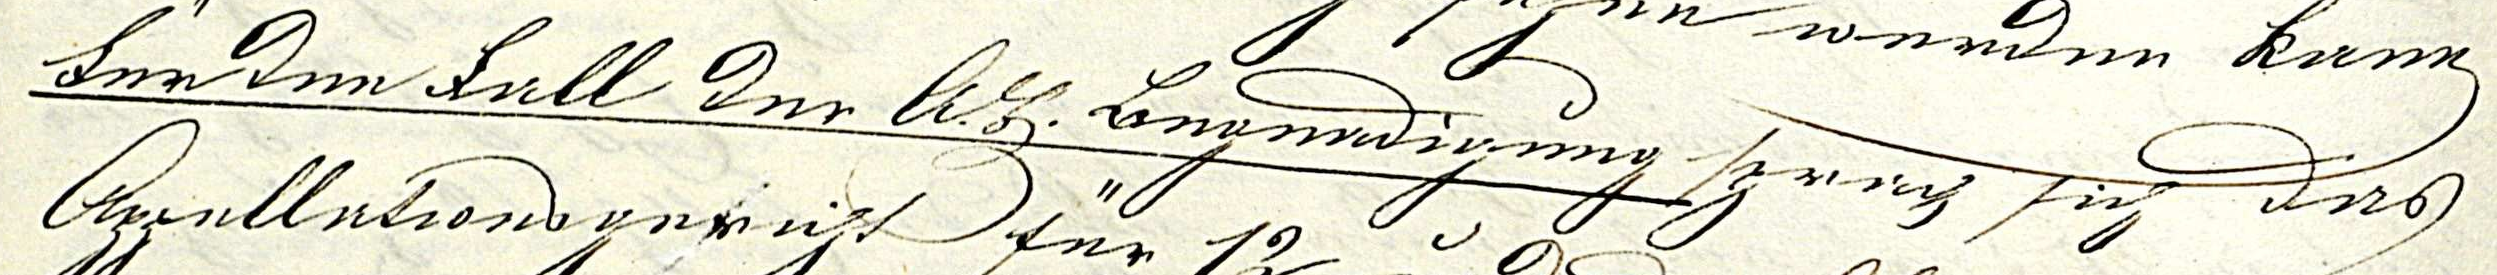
für den Fall der A.h. Begnadigung sprach sich das
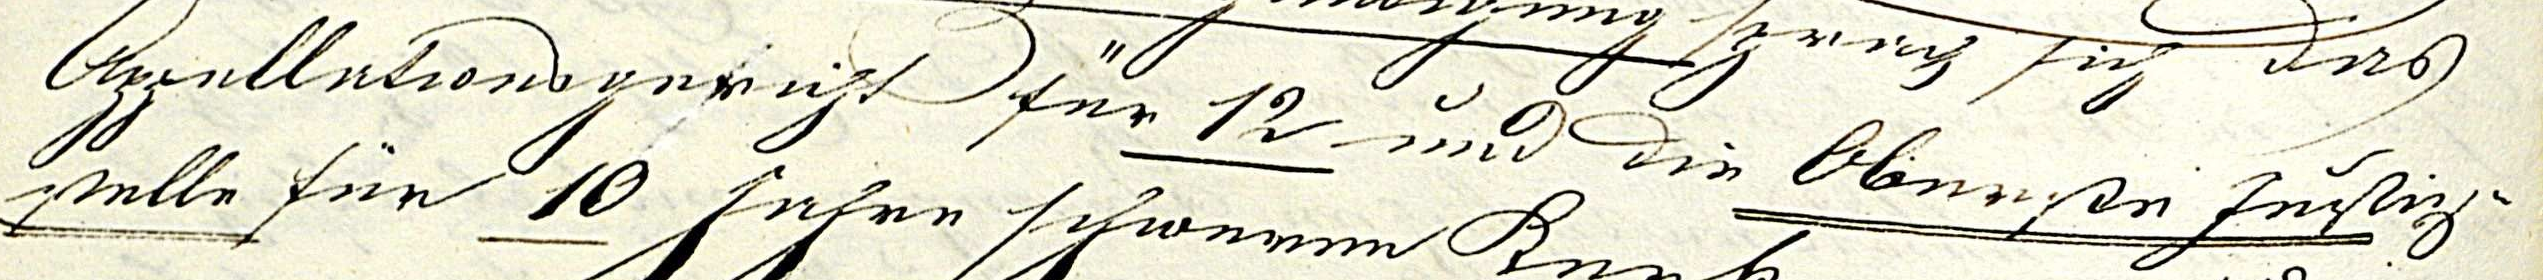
Appellationsgericht für 12 und die Oberste Justiz¬
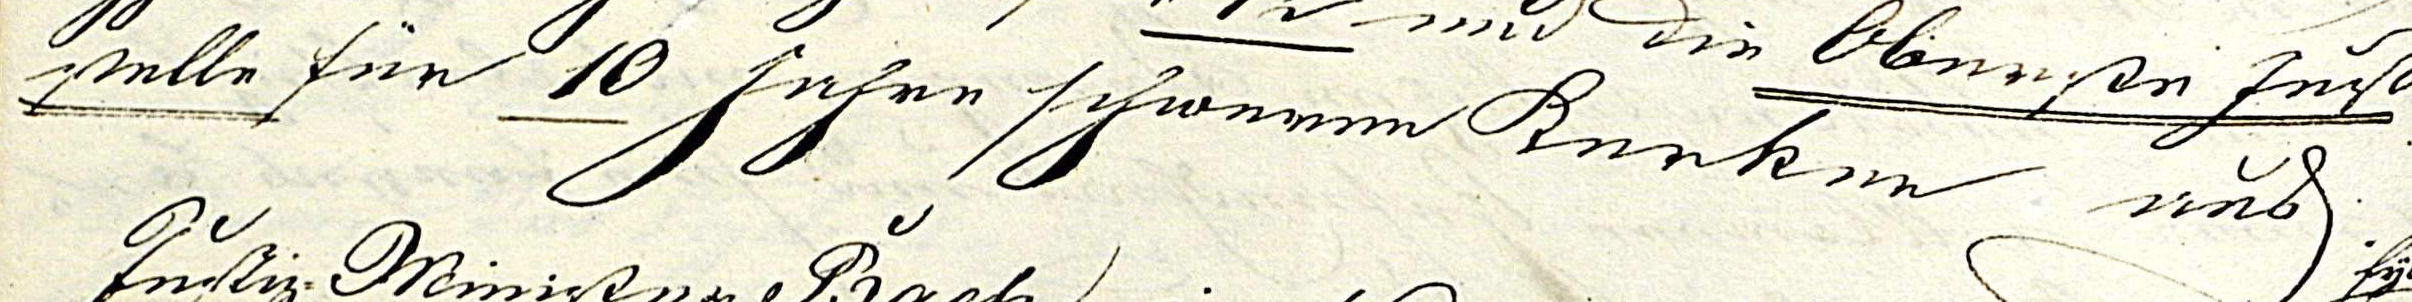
stelle für 10 Jahre schweren Kerker aus.
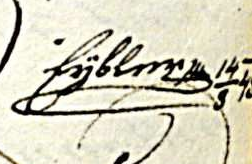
Eybler 14/8/48
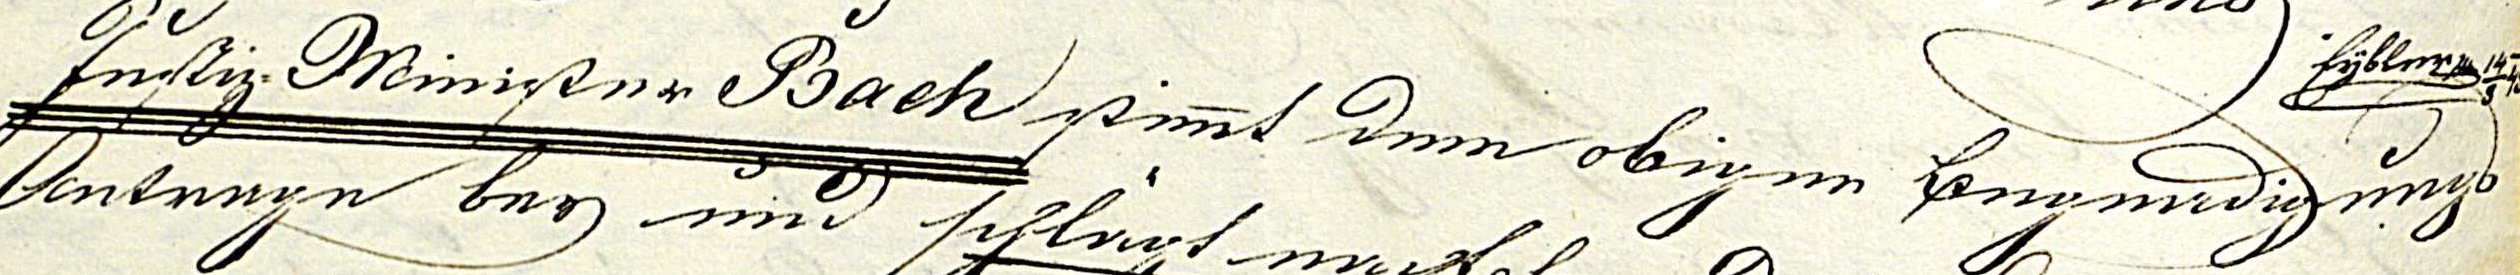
Justiz Minister Bach stimmt dem obigen Begnadigungs
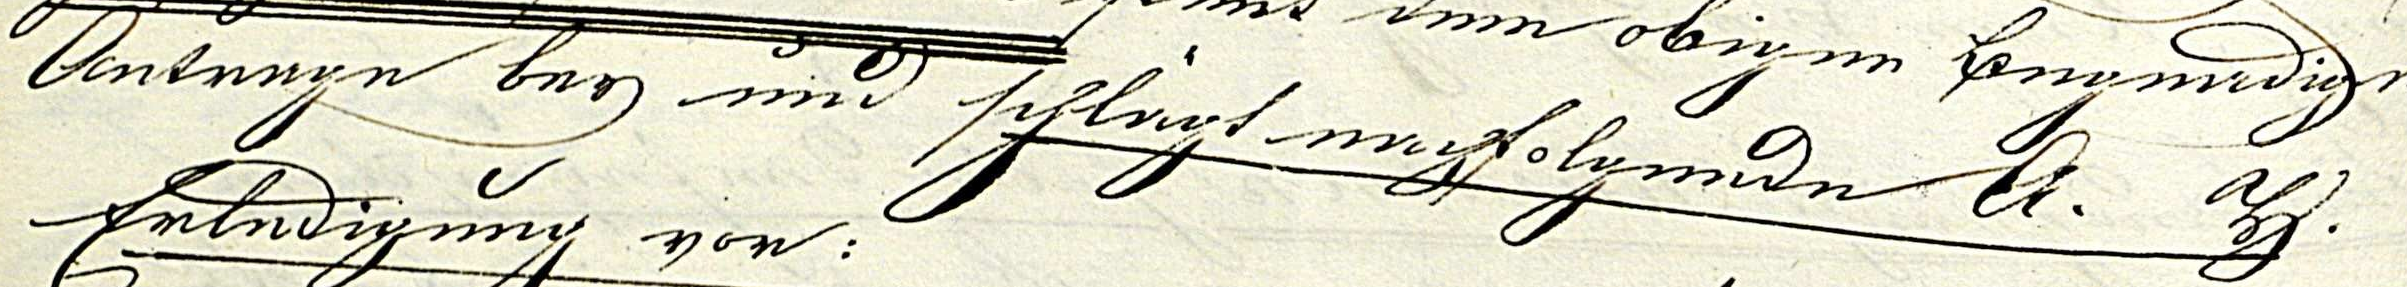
Antrage bey und schlägt nachfolgende A.H.
